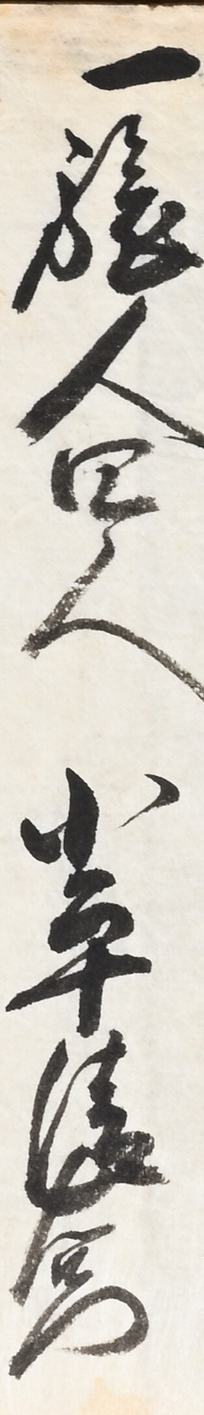一旅人四人小平清右衛門
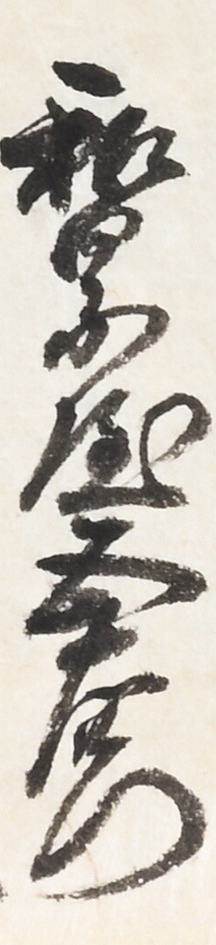和泉屋五右衛門
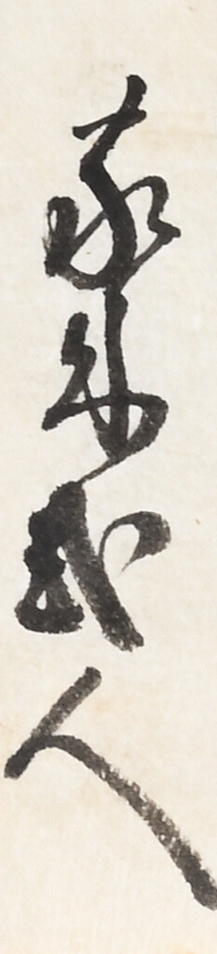家来弐人
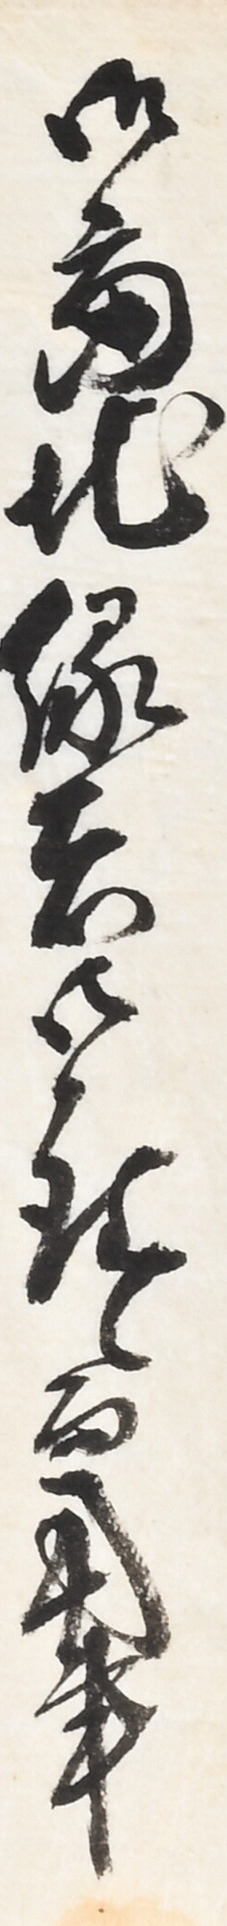御当地縁者御座候而用事
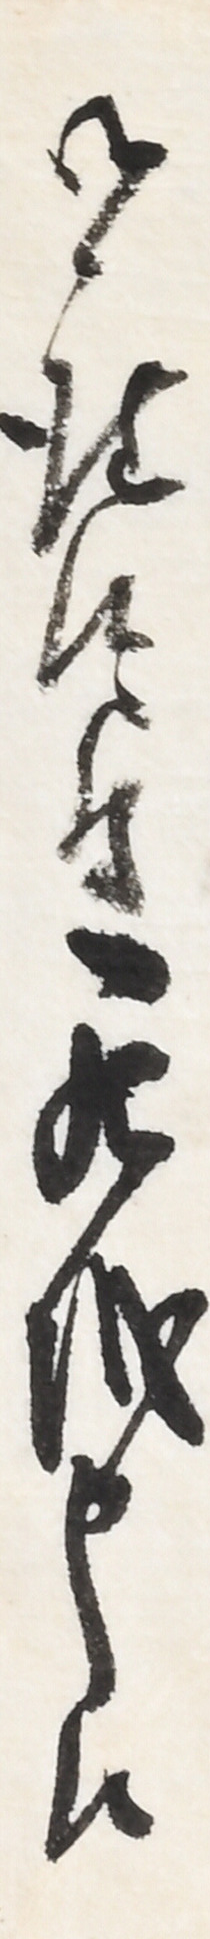御座候ニ付罷越申候
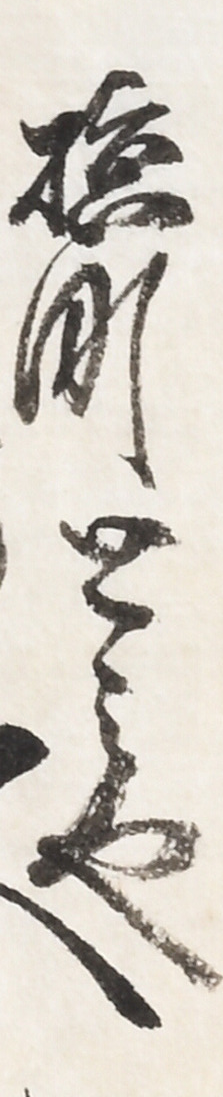横町とみや
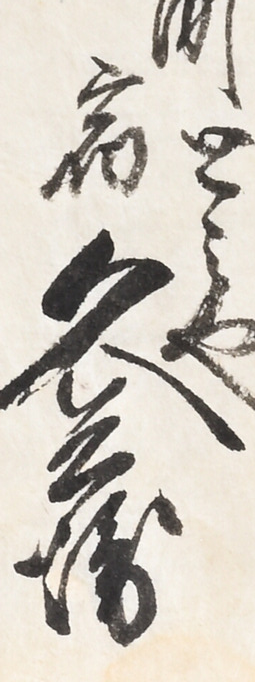宿久兵衛
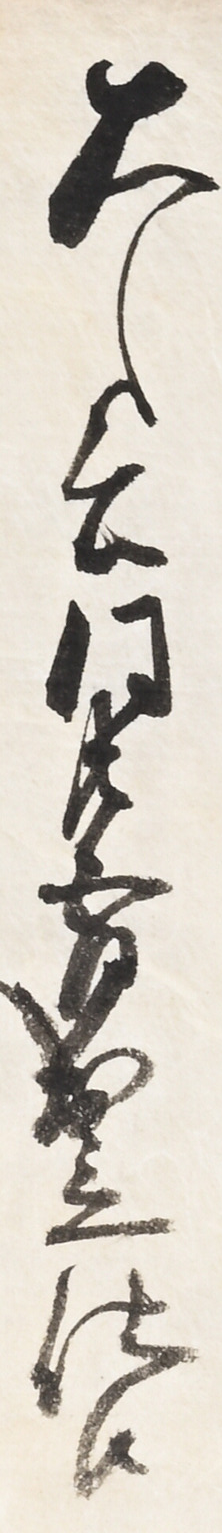右之者同廿五日出立仕候
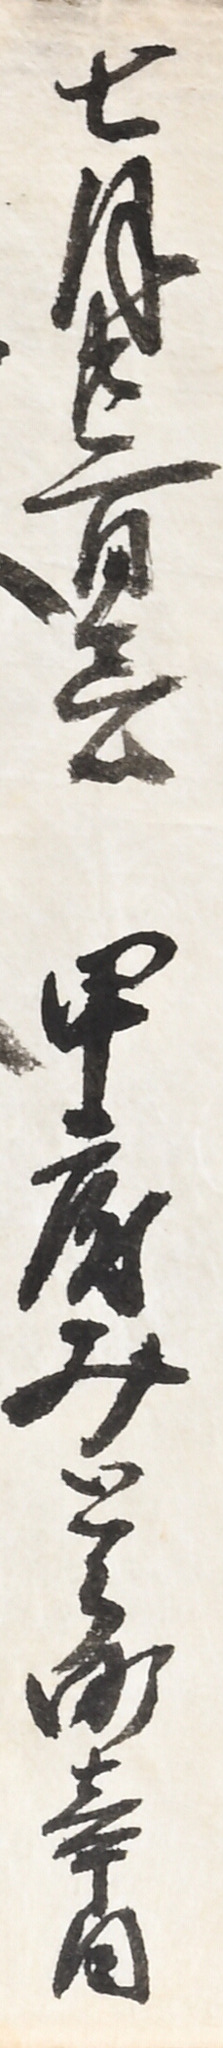七月廿ニ日着甲府みとら町壱丁目
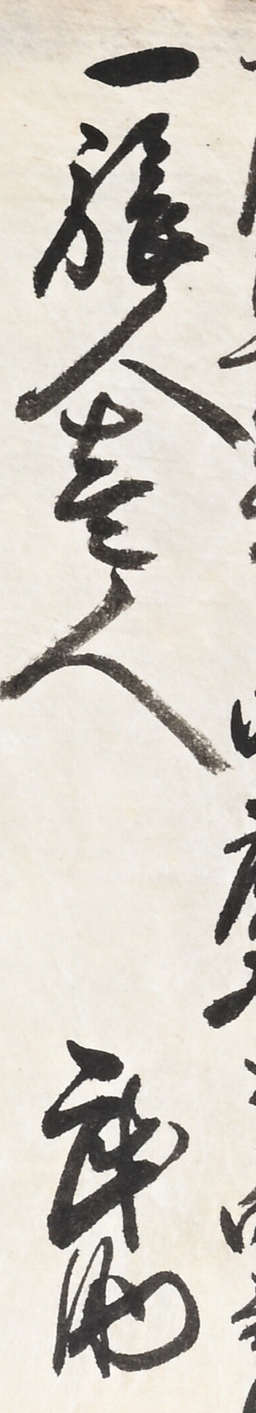一旅人壱人武助
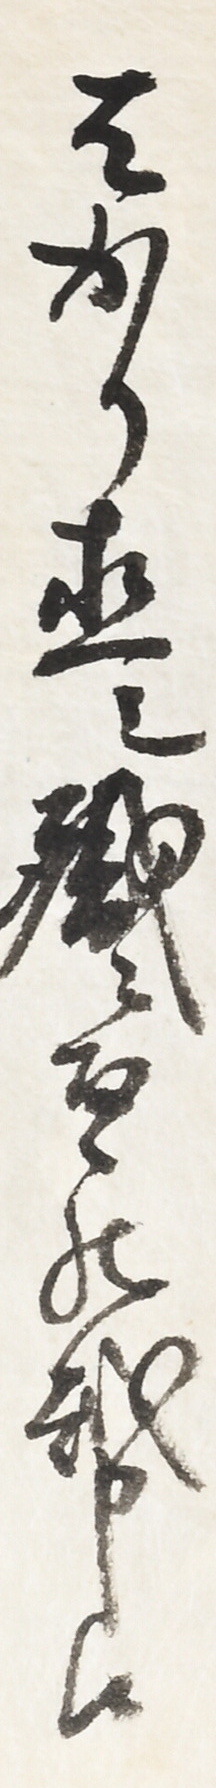はかり直シ職ニ而罷越申候
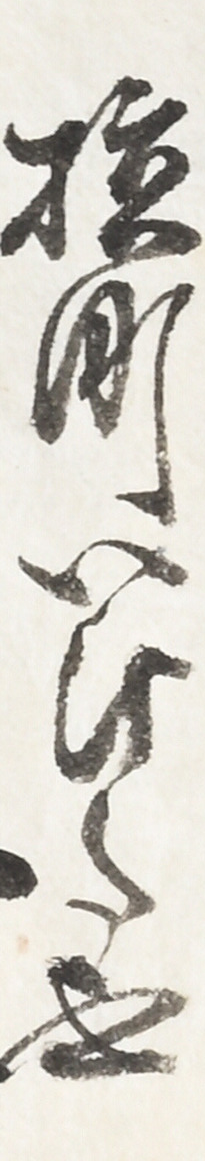横町いけたや
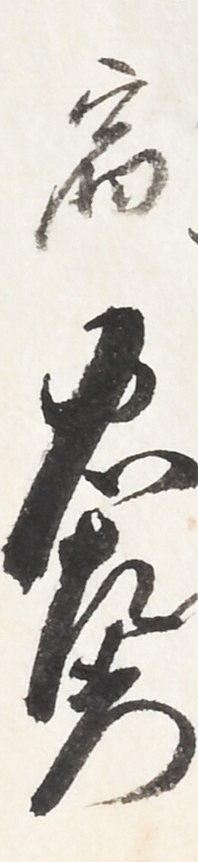宿忠左衛門
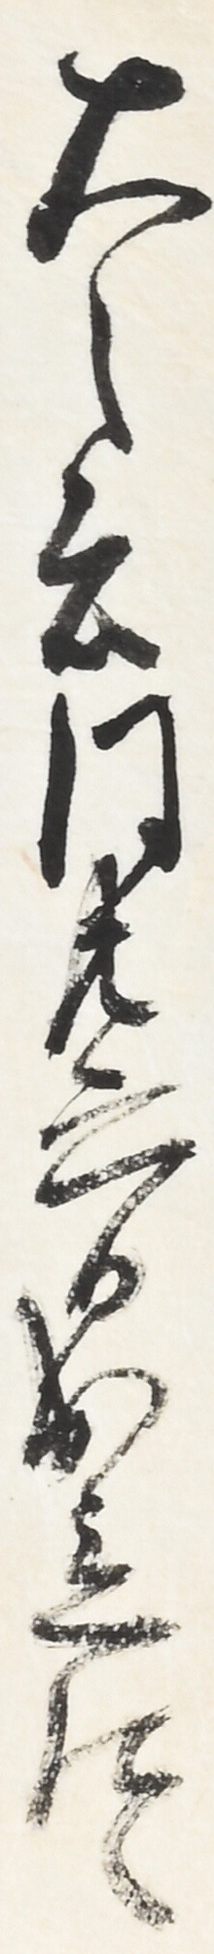右之者同廿六日出立仕候
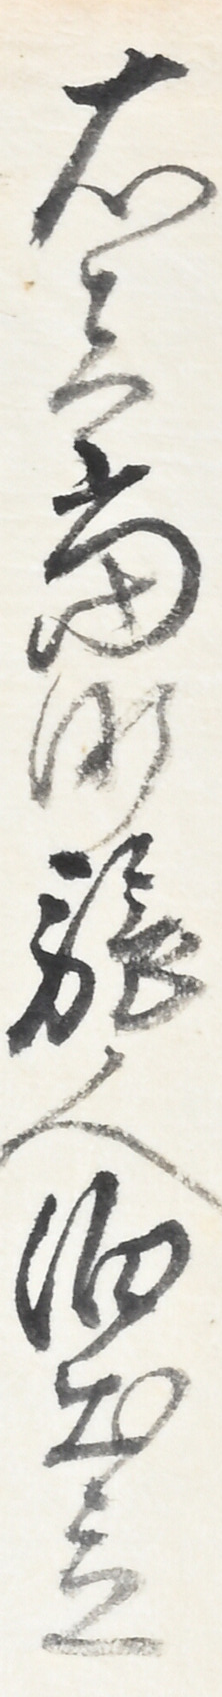右者当町旅人泊出立

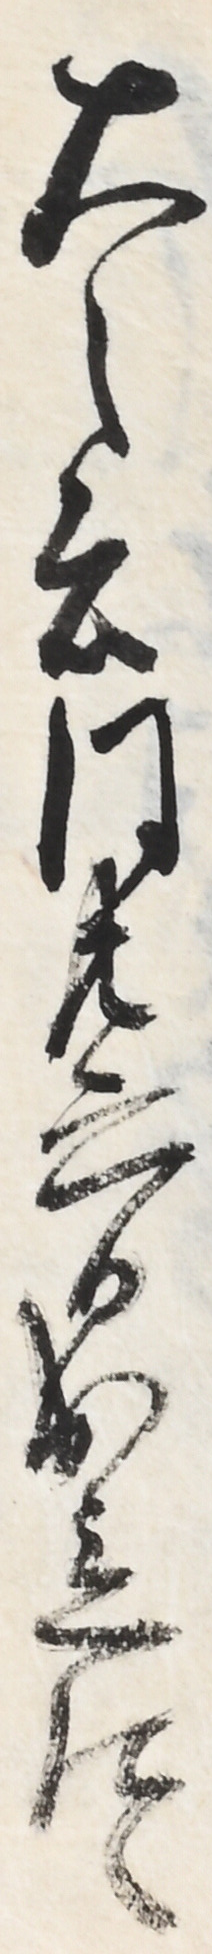右之者同九日出立仕候
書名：旅人泊控帳
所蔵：伊那市立高遠町図書館・合同会社AMANE
